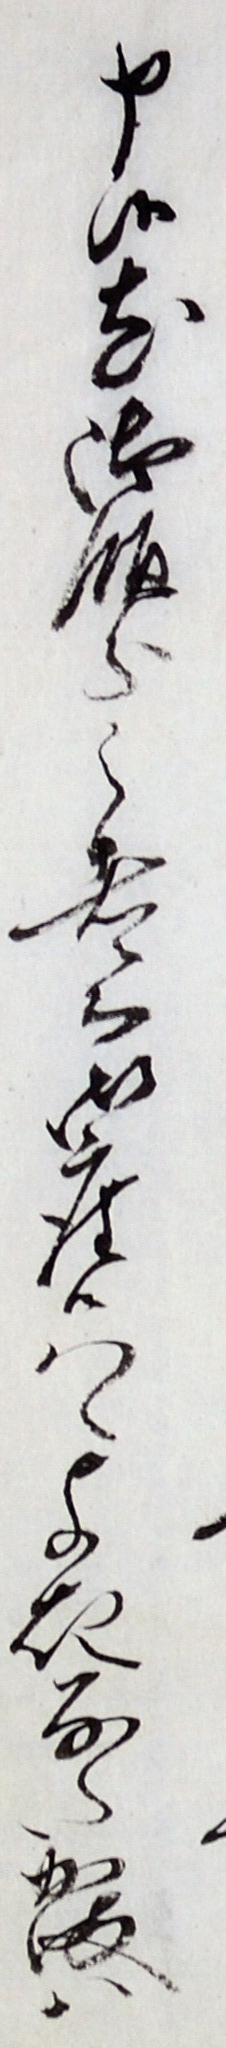申候尤御領分之者ニ而御座候ハヽよきなたかまハ

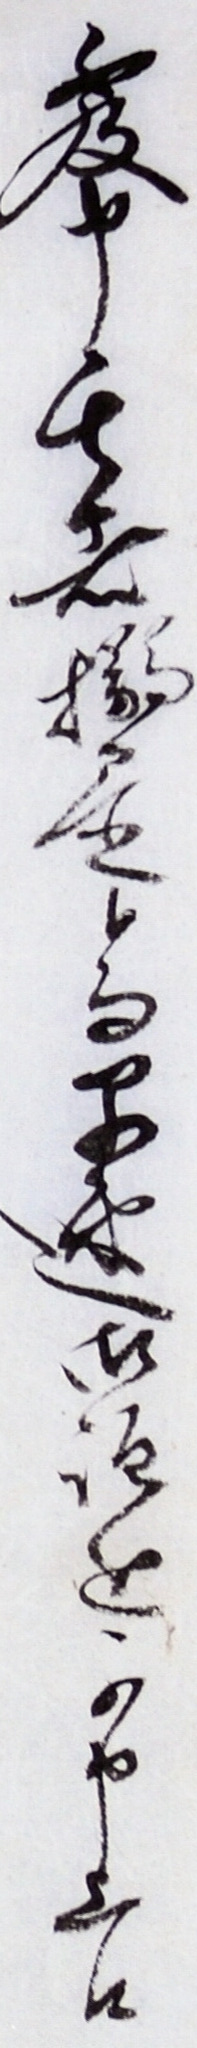不及申其者搦置候而早速御注進可申候
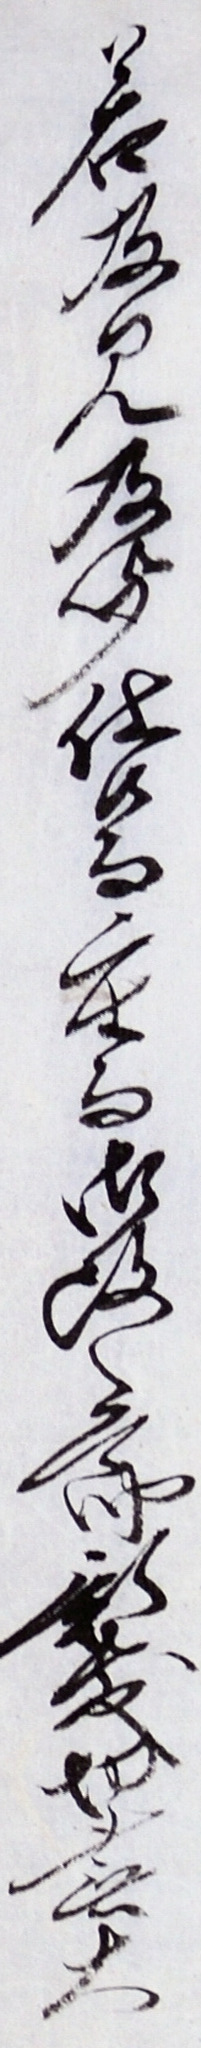若及見及聞仕候而重而御改之節新敷切蕪大
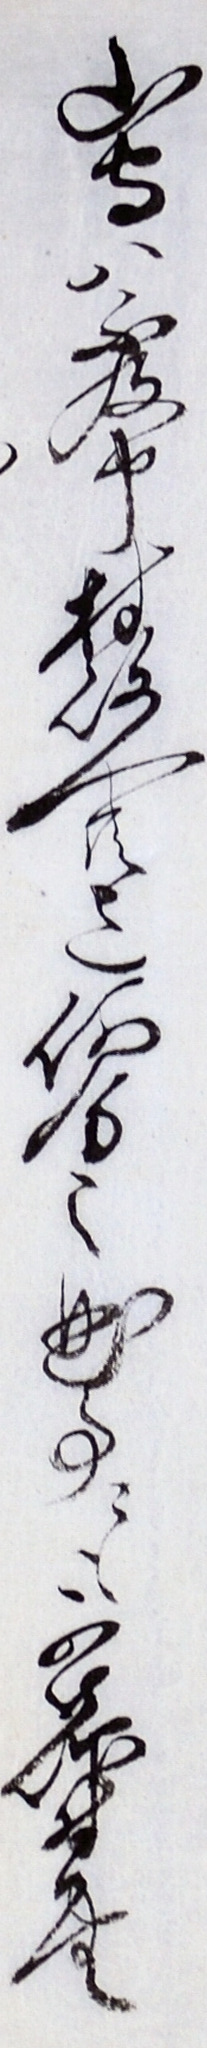山守ハ不及申村役人共迄何分之曲事ニも可被仰付御座候
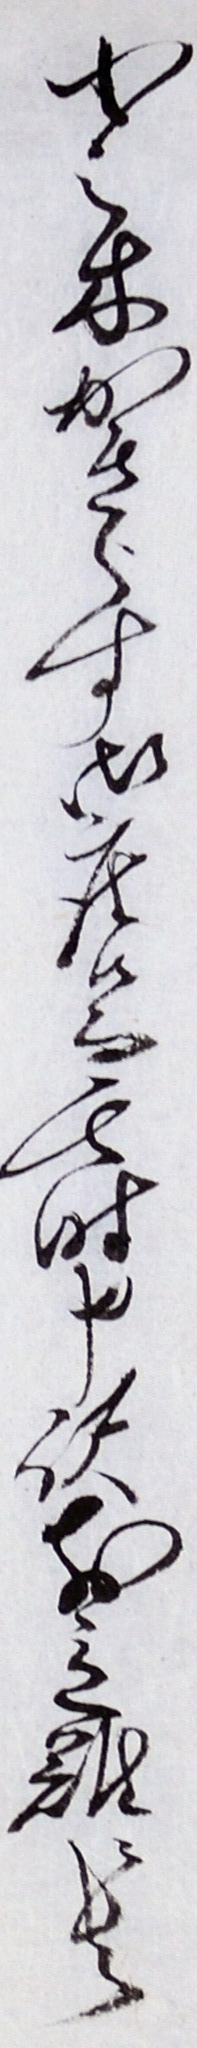小之木かきらす御座候而其時申訳於立難ニは
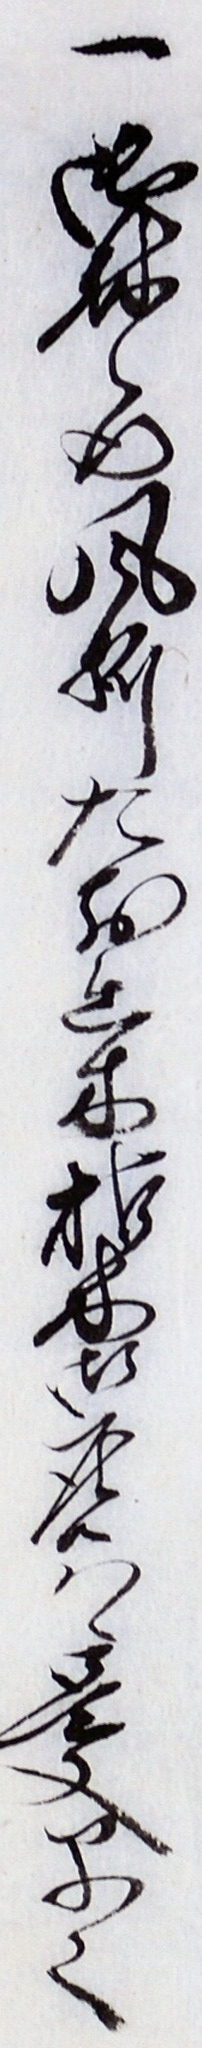一御林之内風折たおれ木枯木御座候ハヽ是又早々
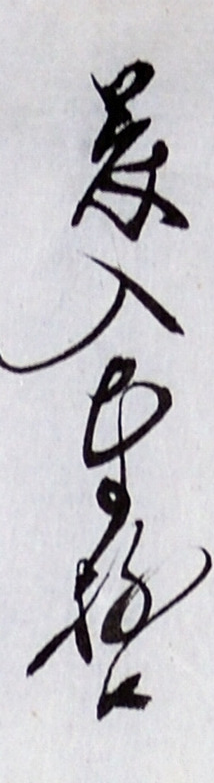畏入奉存候
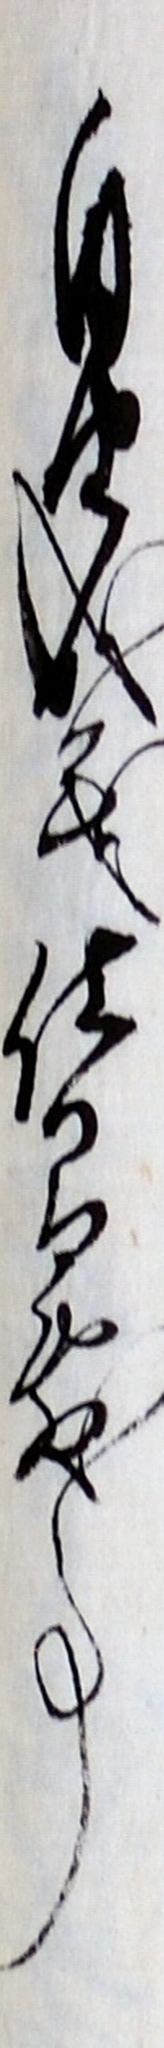自由成義仕間敷事
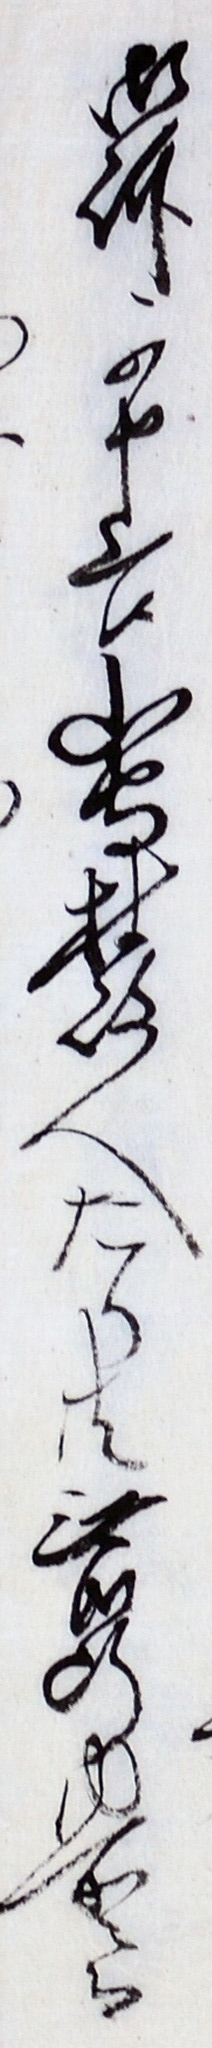御訴可申上候山守村役人たり共無御断内所ニ而
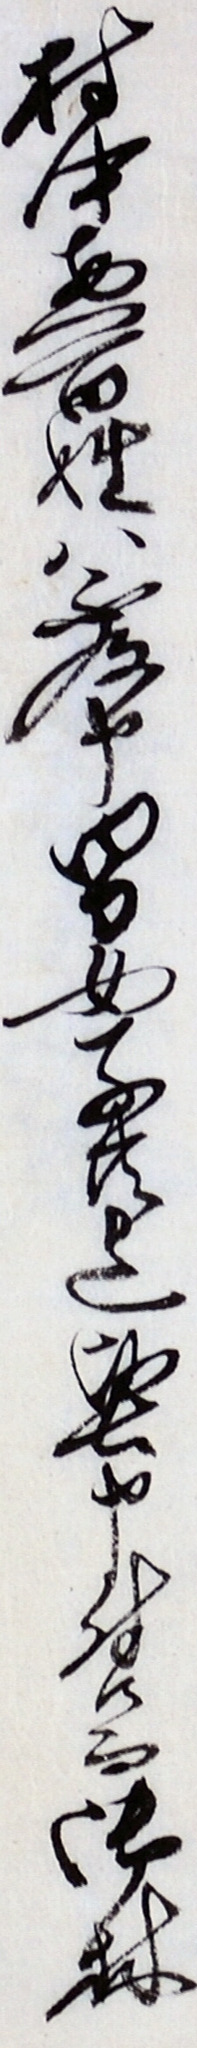村中惣百姓ハ不及申男女子共迄堅申付候而御林
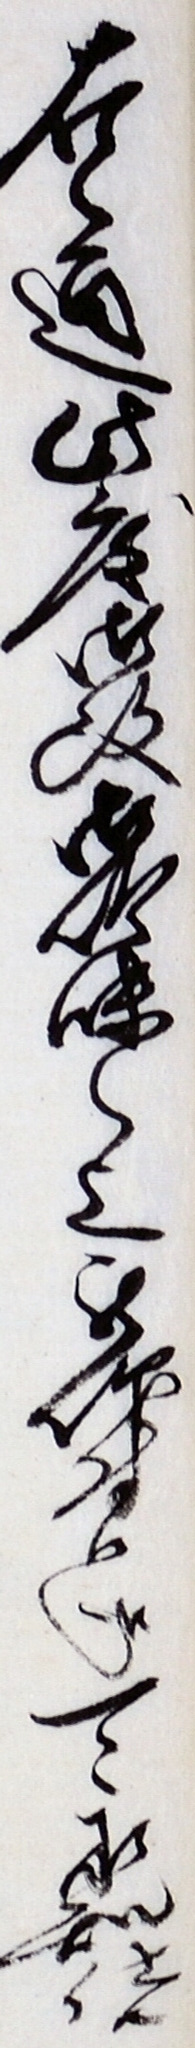右之通此度御改御吟味之上被仰付候趣一々承知仕候
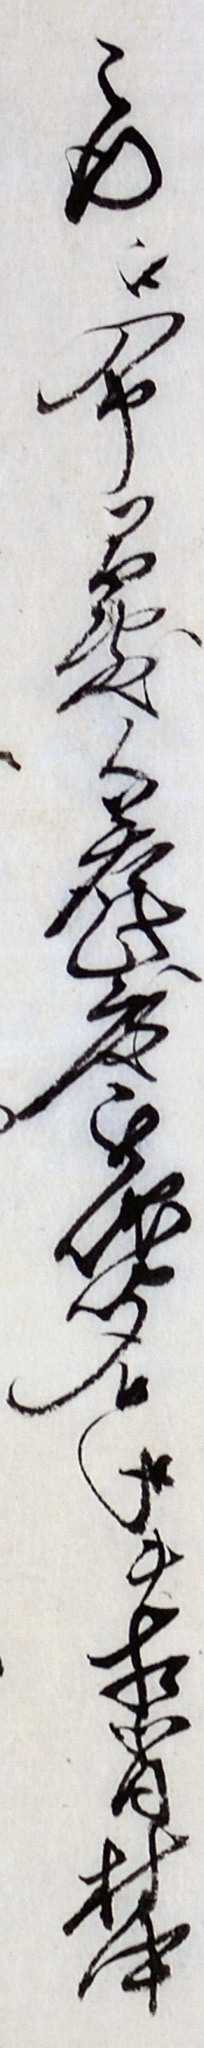之内え入申間敷候若此度被仰聞候趣ヲ相背村中
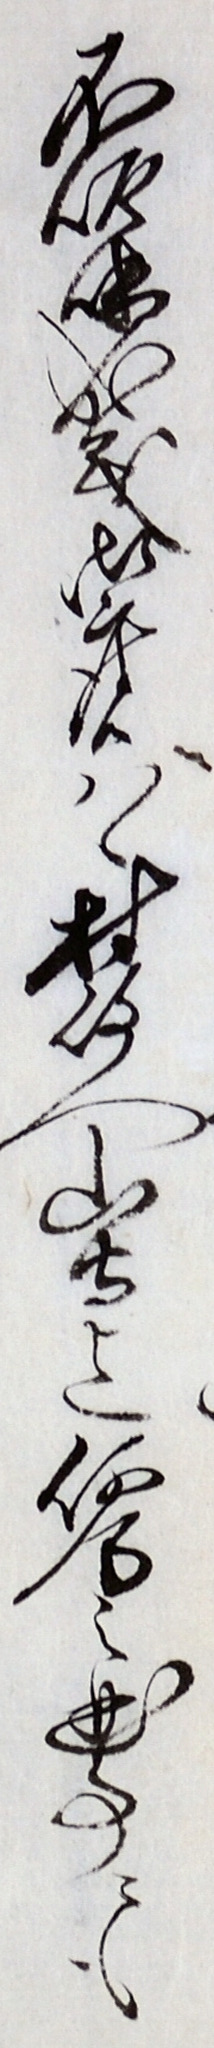不吟味成義御座候ハヽ村役人山守迄何分之曲事ニも
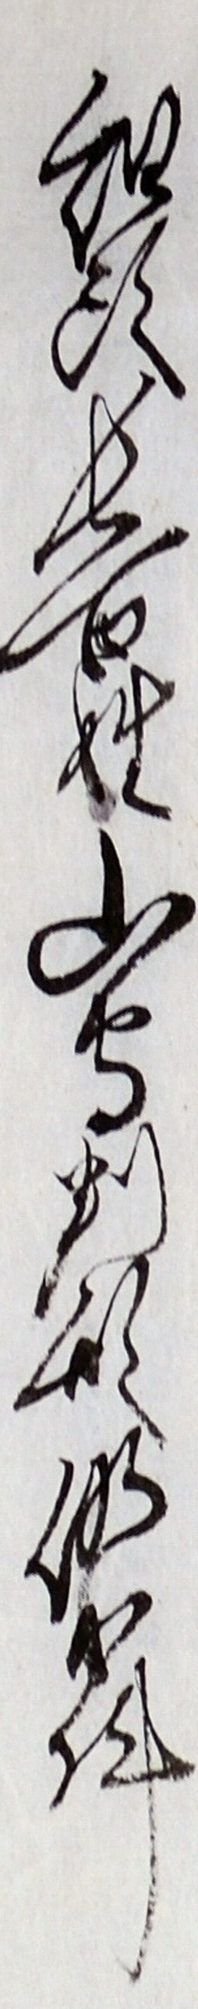組頭長百姓山守判形仍如件
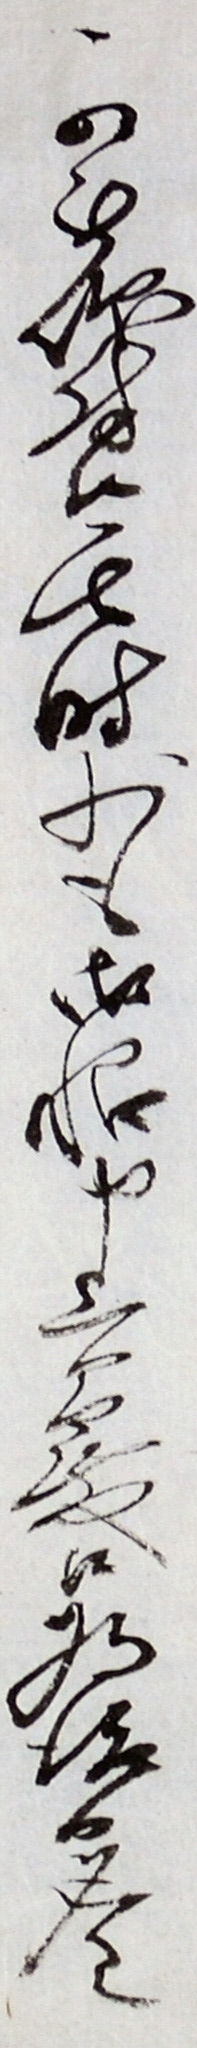可被仰付候其時少も御恨申上間敷候為後日名主
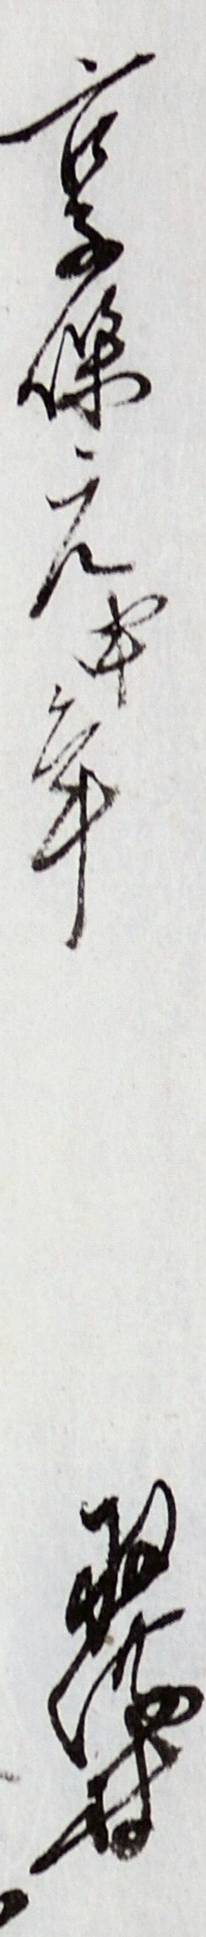享保元申年羽村
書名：御林御竹藪証文控
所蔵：伊那市立高遠町図書館・合同会社AMANE
